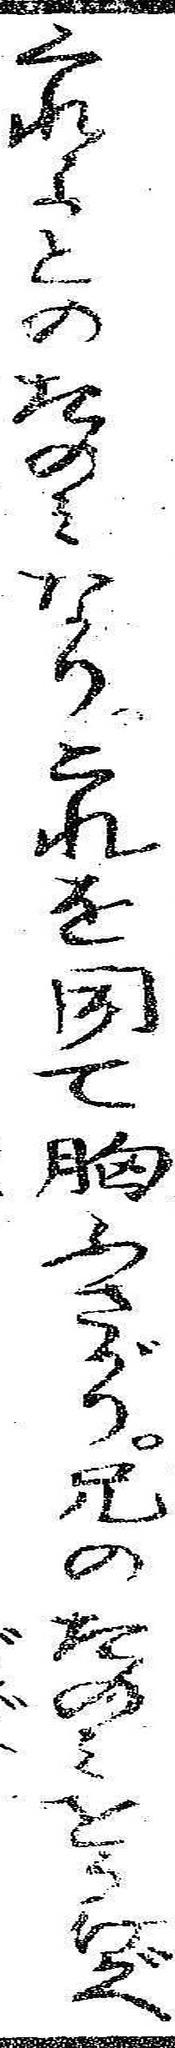くれよとのたのみなり。これを聞て胸ふさがり。兄のたのみをうけがへ
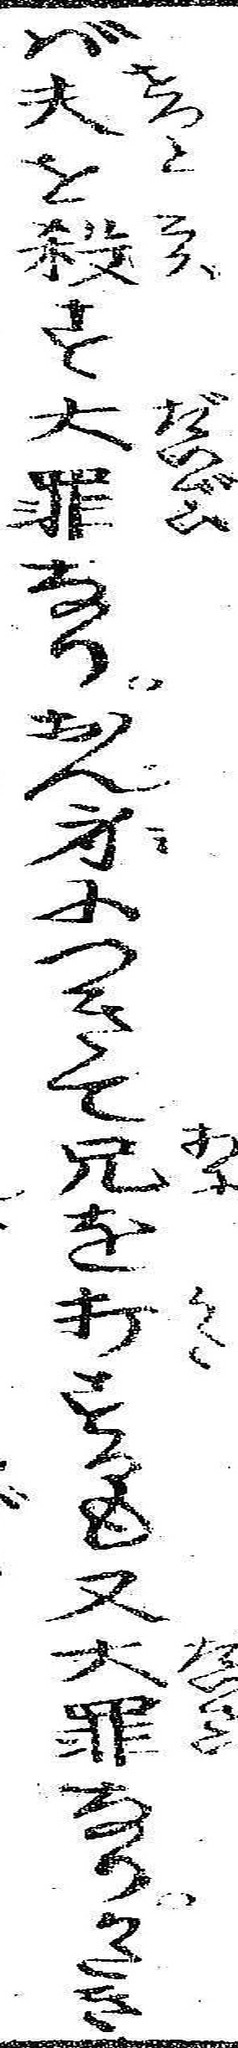ば夫を殺す大罪なり。おん身につきて兄を打するも又大罪なり。かたき
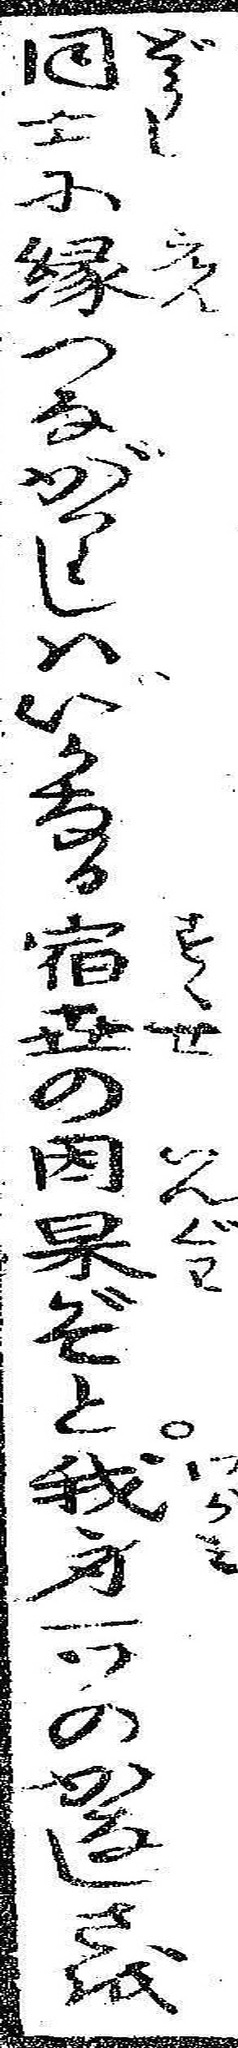同士に縁つながりしは。いかなる宿世の因果ぞと。我身一つのかなしさを
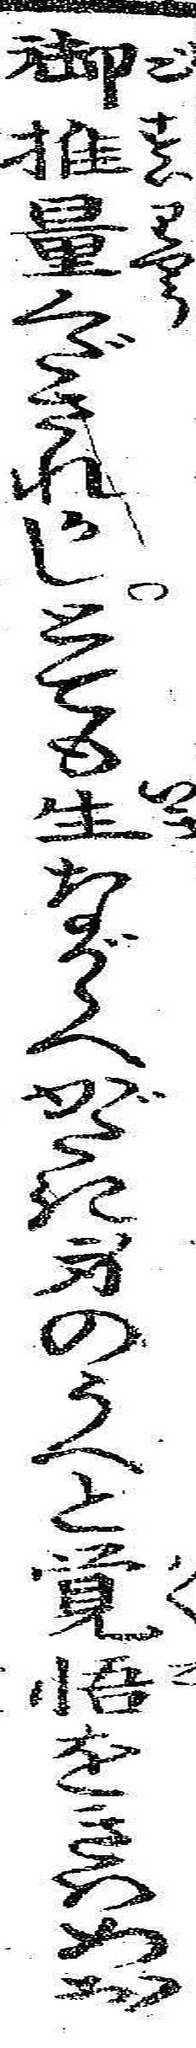御推量くだされかし。とても生ながらへがたき身のうへと覚悟をきはめお
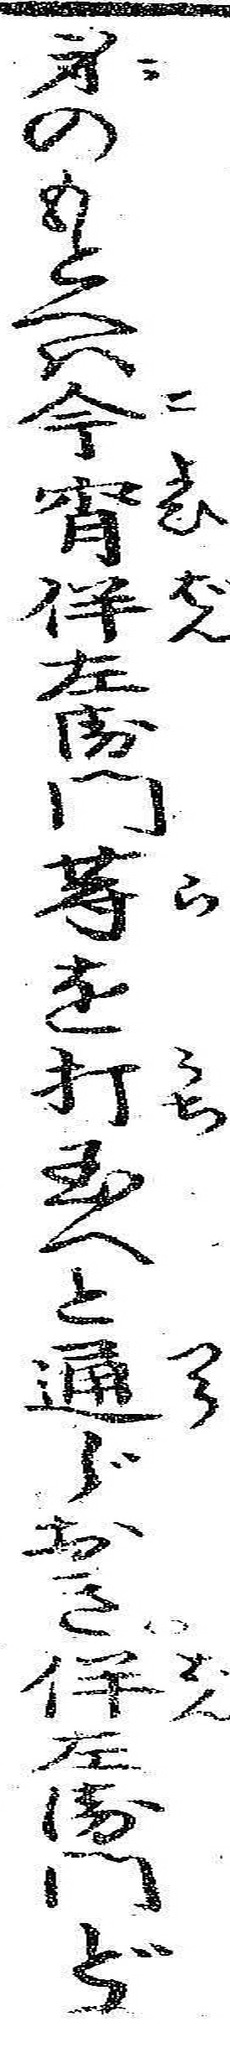身のもとへは今宵伴左衛門等を打玉へと通じおき。伴左衛門ど
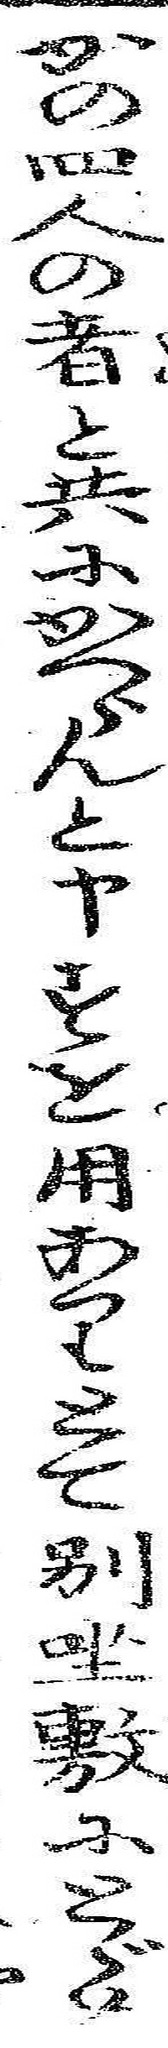かの四人の者と共にかへらんと申すを。用ありとて別坐敷にとゞ
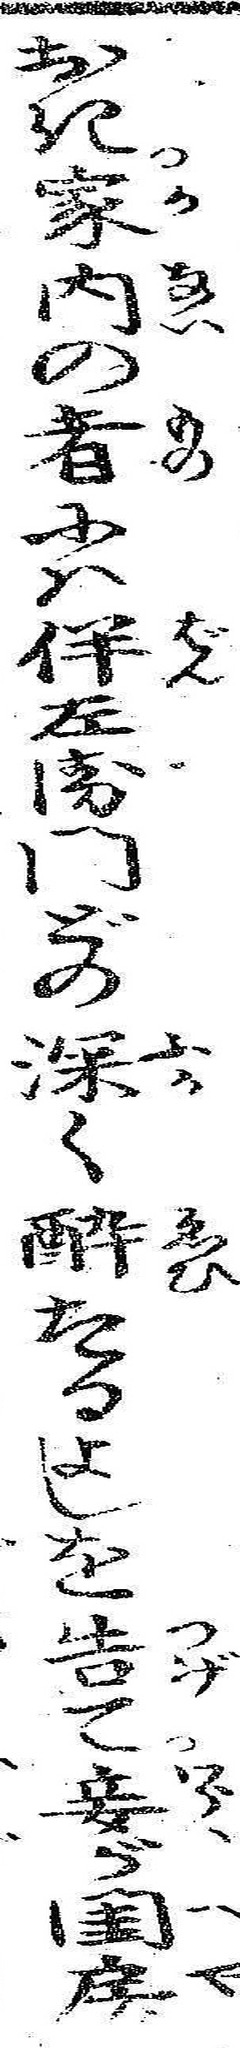おき。家内の者には伴左衛門どの深く酔たるよしを告て。妾が閨房
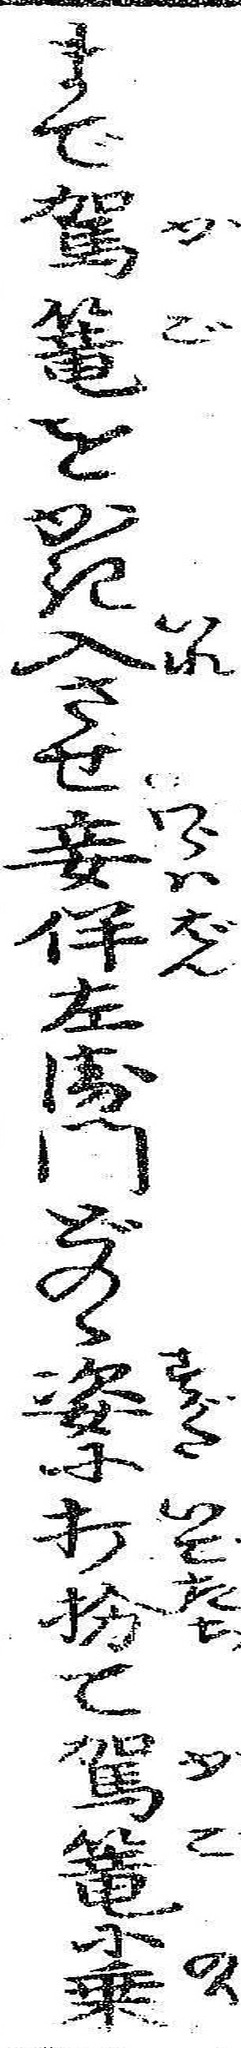まで駕篭をかき入させ。妾伴左衛門どのゝ姿に打扮て駕篭に乗
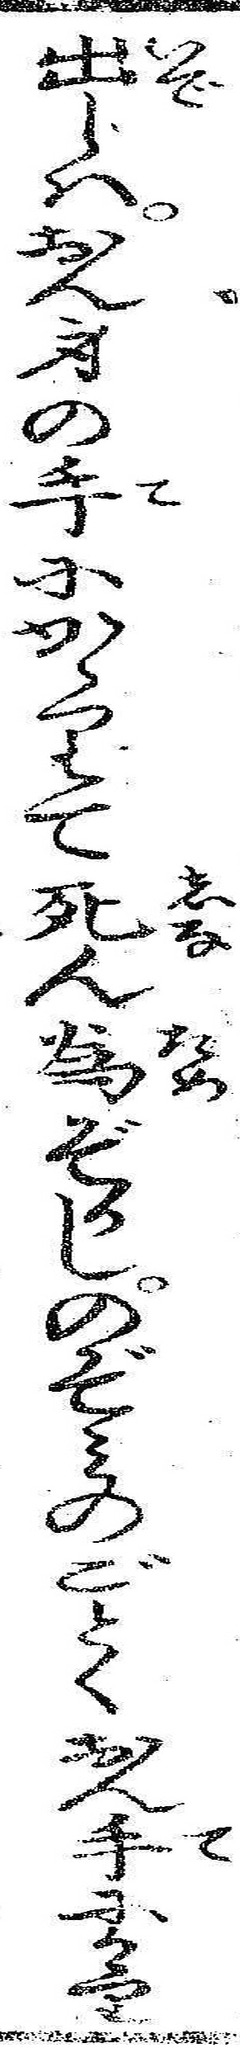出しは。おん身の手にかゝりて死ん為ぞかし。のぞみのごとくおん手にかゝり
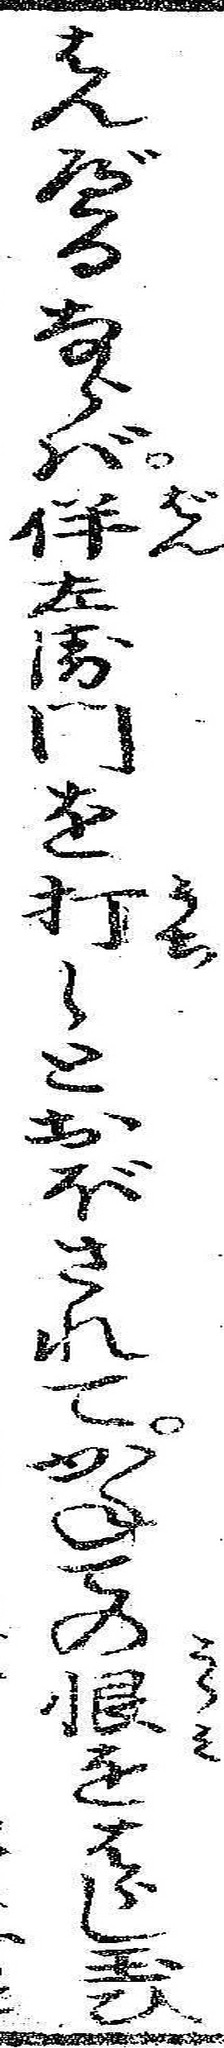はんべるならば。伴左衛門を打しとおぼされて。かねての恨をはらし玉ひ
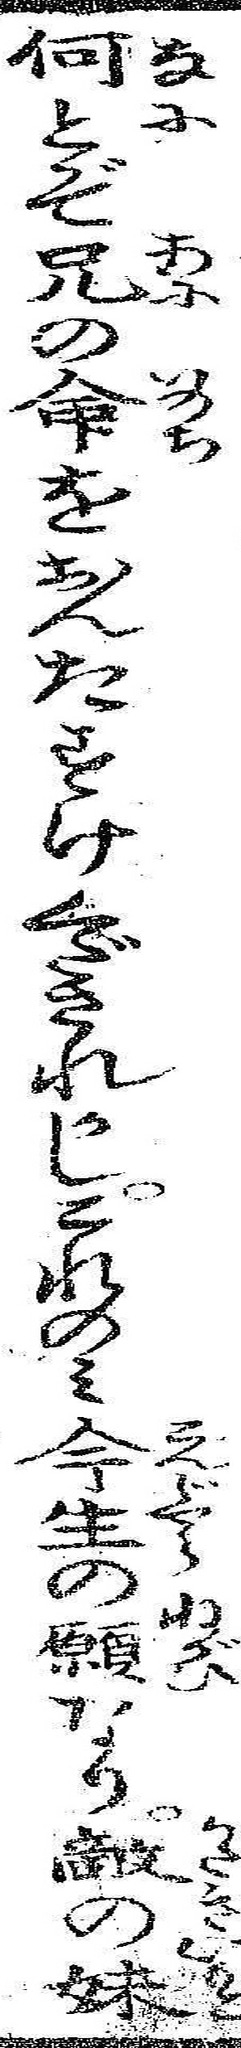何とぞ兄の命をおんたすけくだされかし。これのみ今生の願なり。敵の妹
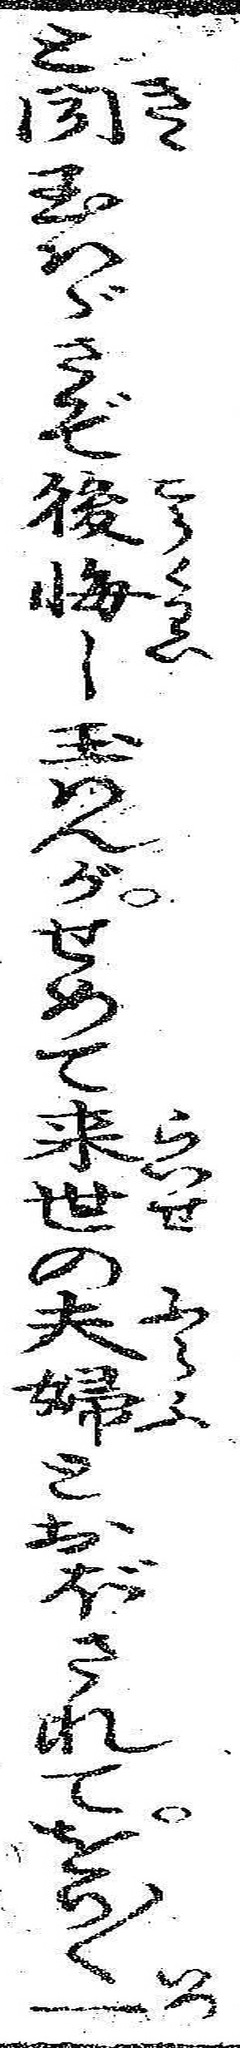と聞玉はゞさぞ後悔し玉はんが。せめて来世の夫婦とおぼされて。をり〳〵一
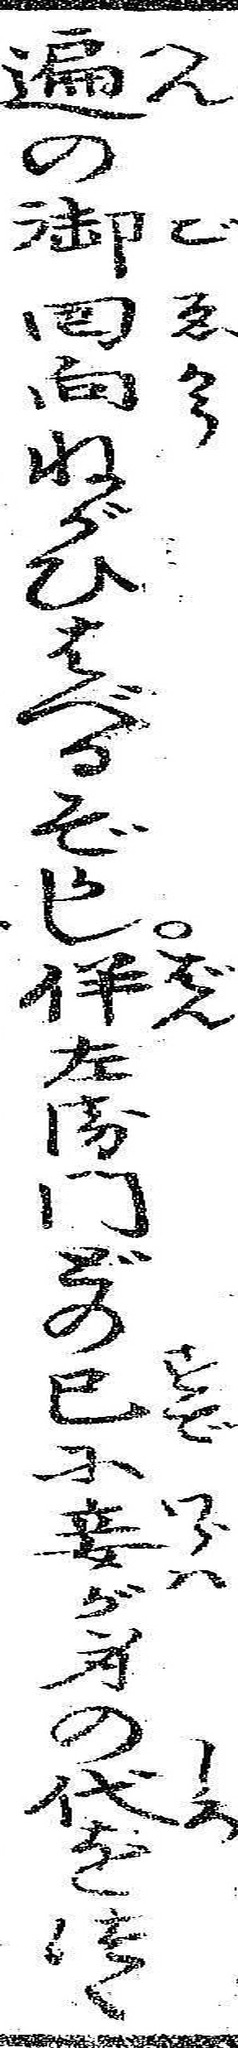遍の御回向ねがひはべるぞかし。伴左衛門どの已に妾が身の代をつく
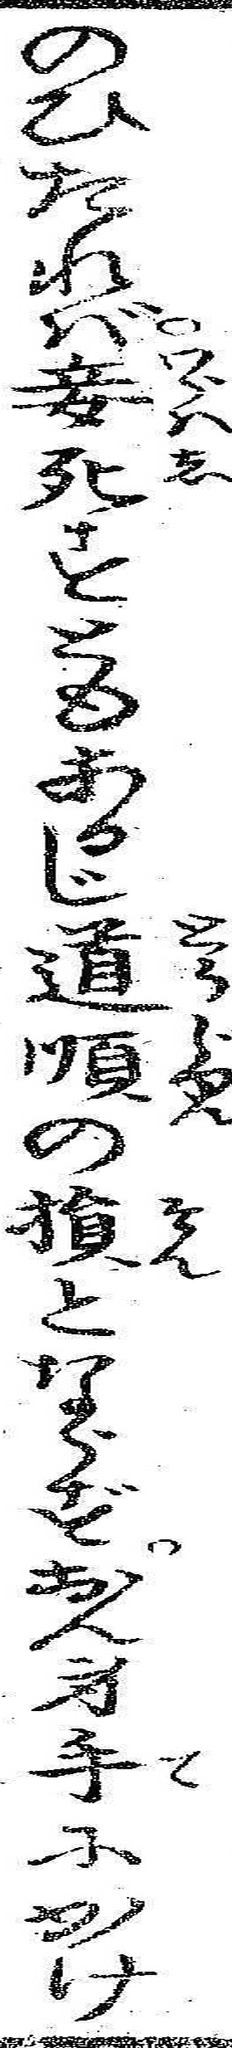のひたれば。妾死すともあるじ道順の損とならず。おん身手にかけ

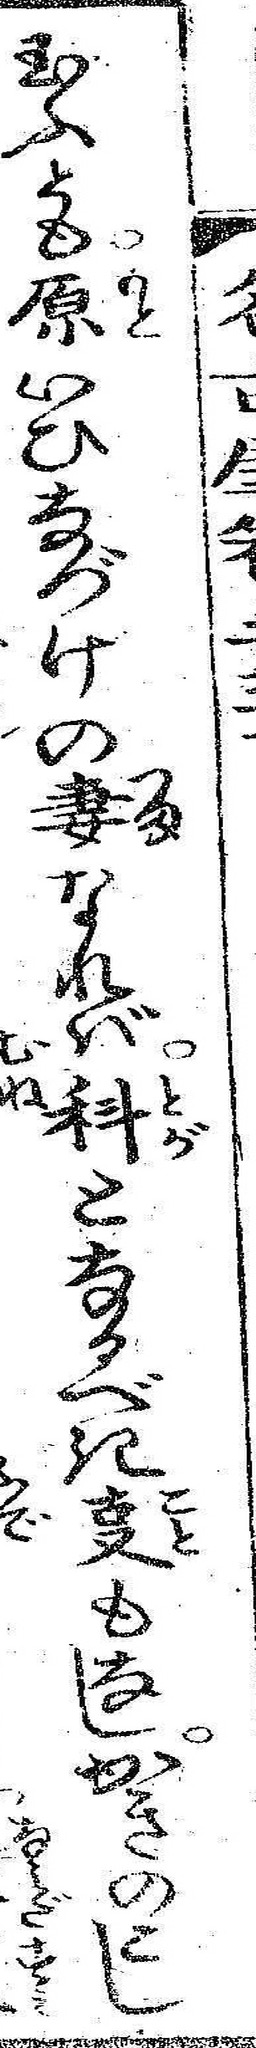玉ふとも。原いひなづけの妻なれば。科となるべき事もなし。かきのこし
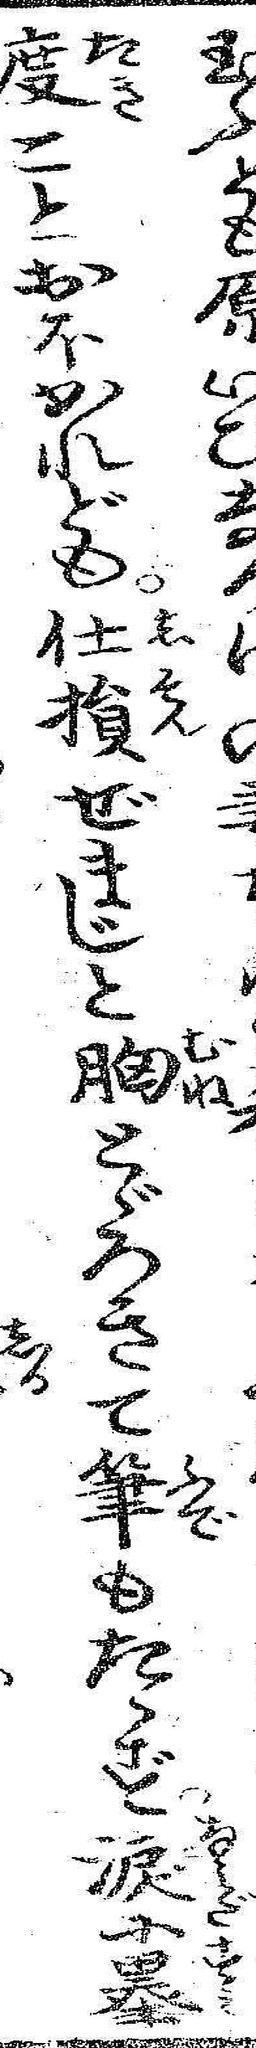度ことおほかれども。仕損ぜまじと胸とゞろきて筆もたゝず。涙に墨
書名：昔話稲妻表紙
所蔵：国文学研究資料館
